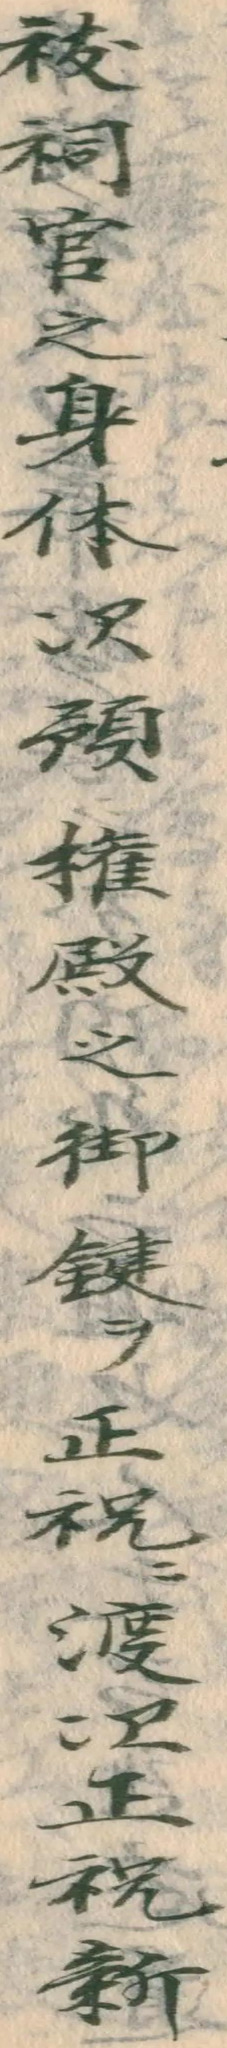祓祠官之身体次預権殿之御鍵ヲ正祝ニ渡次正祝新
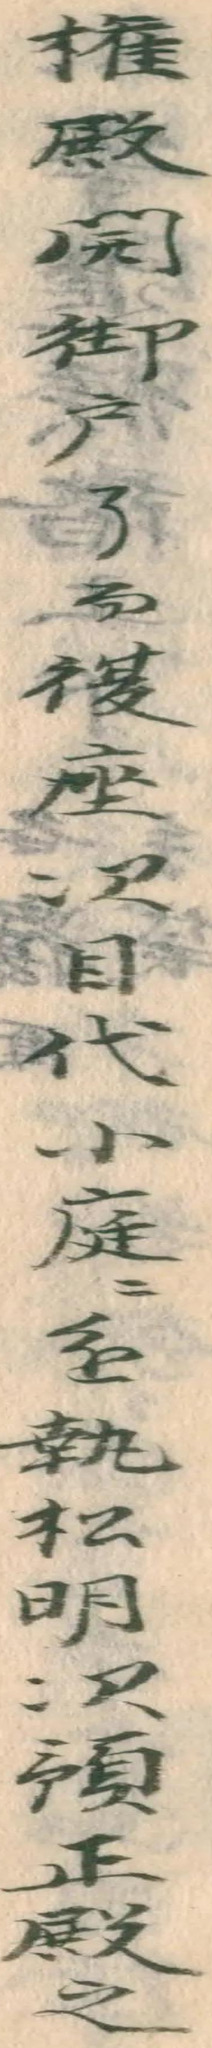権殿開御戸了而復座次目代小庭ニ進執松明次預正殿之
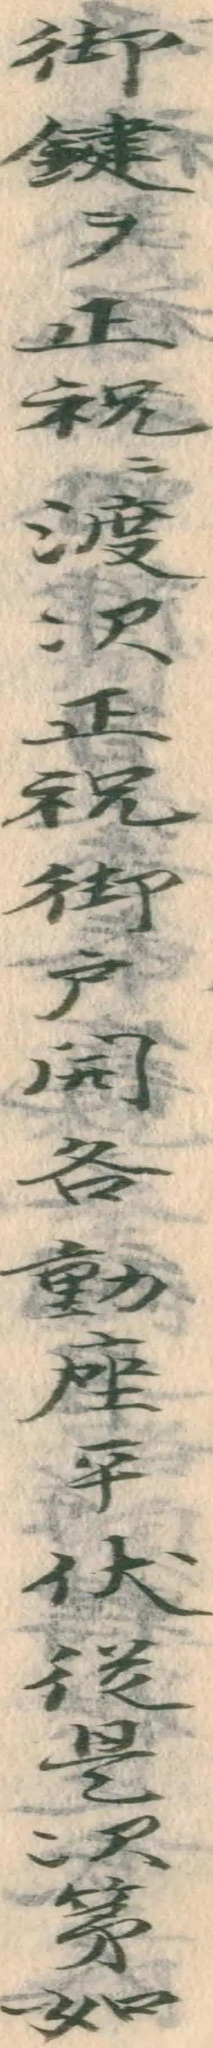御鍵ヲ正祝ニ渡次正祝御戸開各動座平伏従是次第如
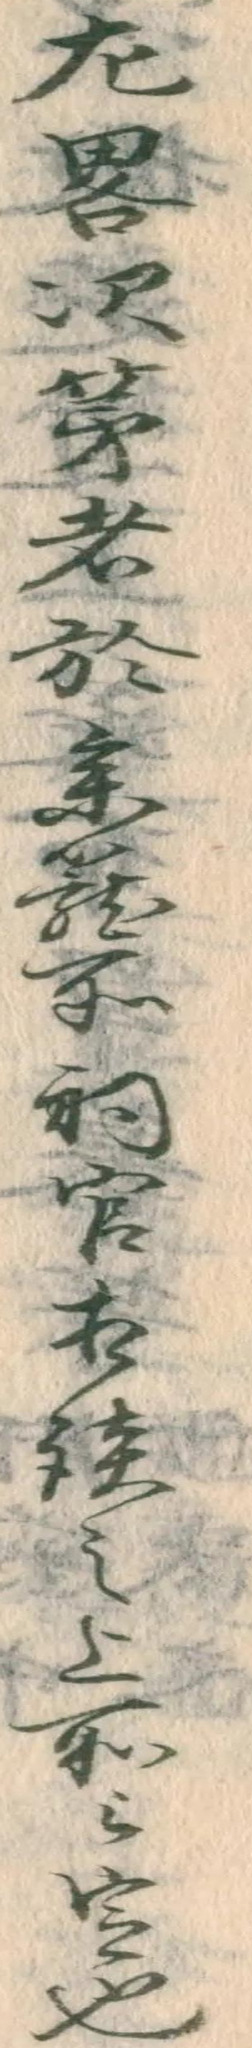左略次第は於参籠所祠官相談之上所被定也
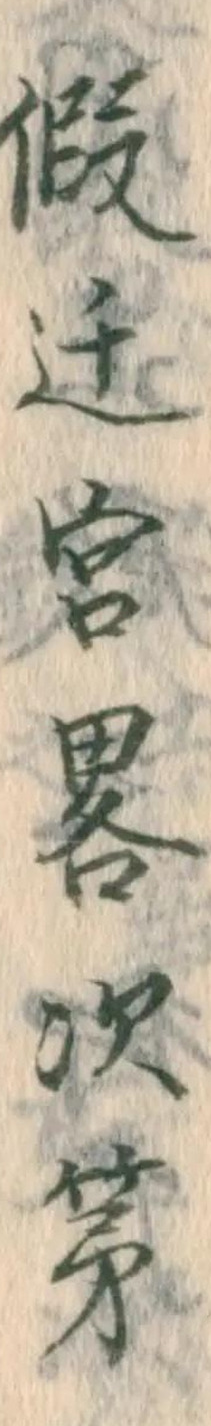仮迁宮略次第
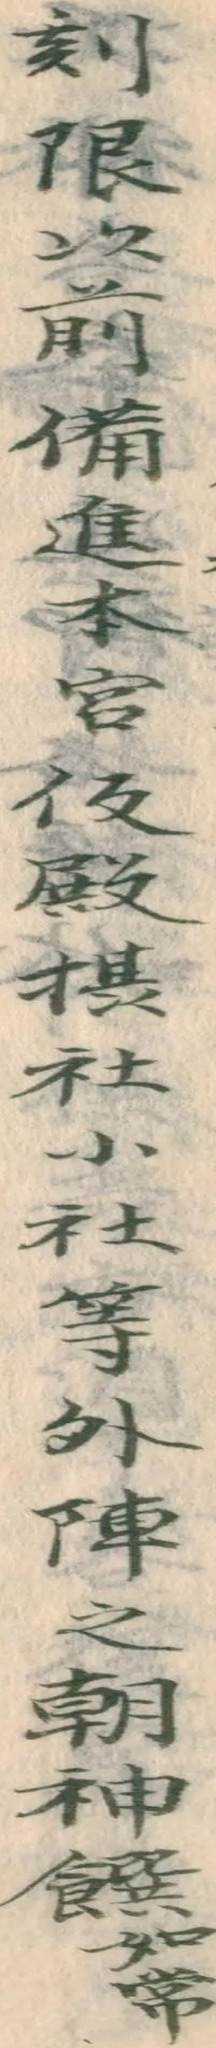刻限以前備進本宮仮殿摂社小社等外陣之朝神饌如常
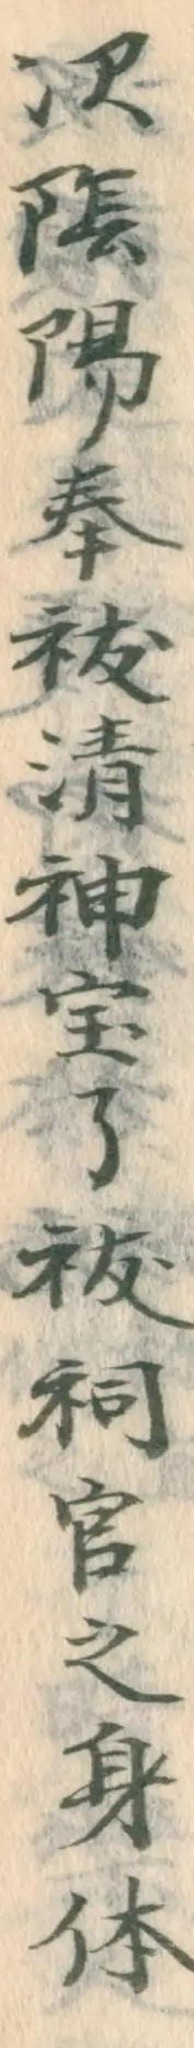次陰陽奉祓清神宝了祓祠官之身体

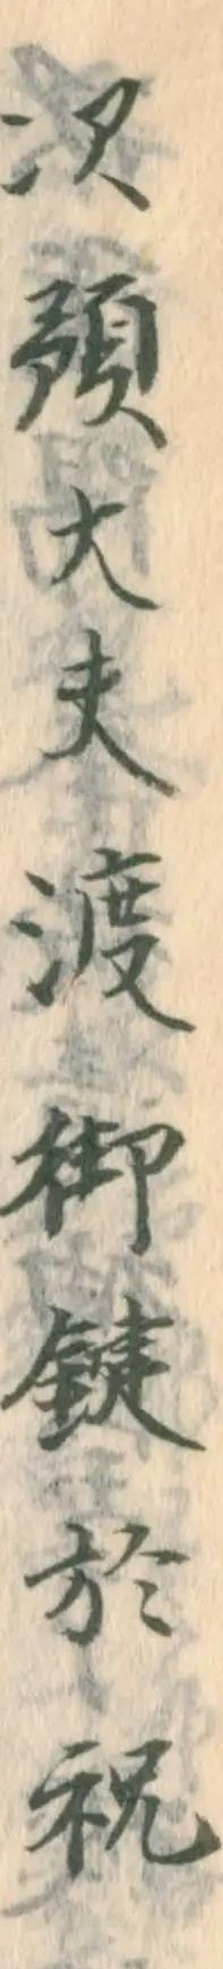次預大夫渡御鍵於祝
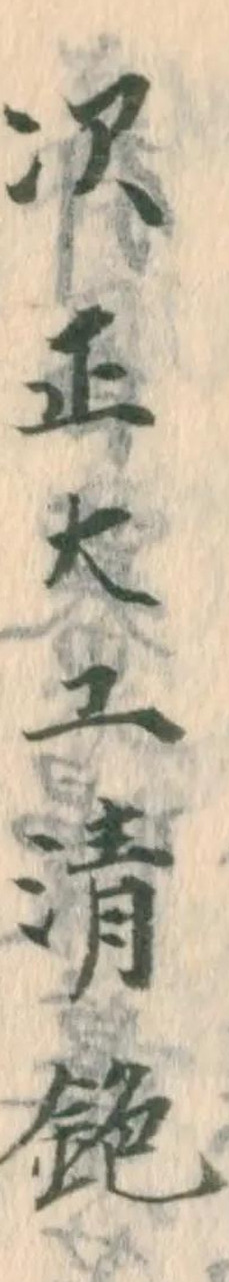次正大工清銫
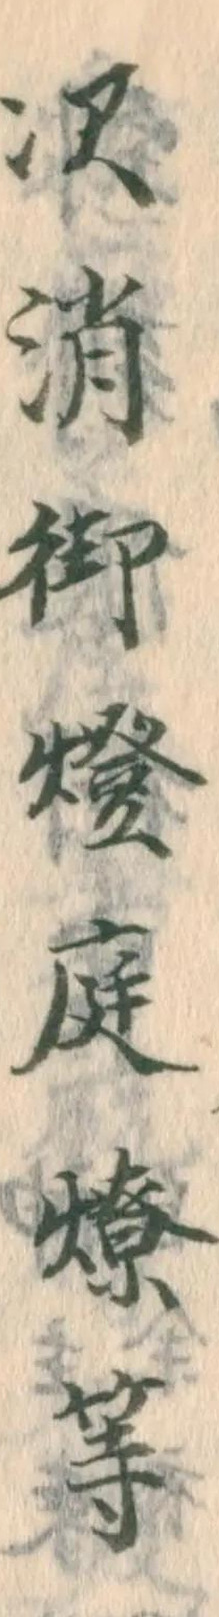次消御燈庭燎等
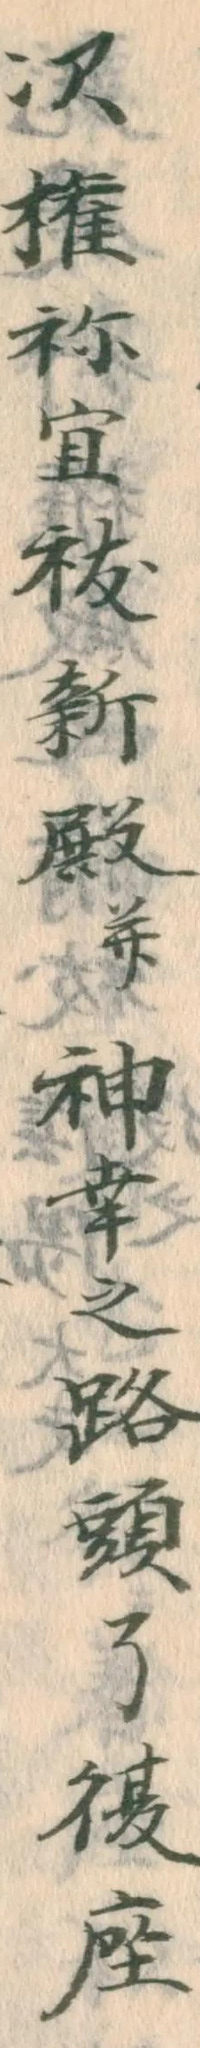次権祢宜祓新殿并神幸之路頭了復座
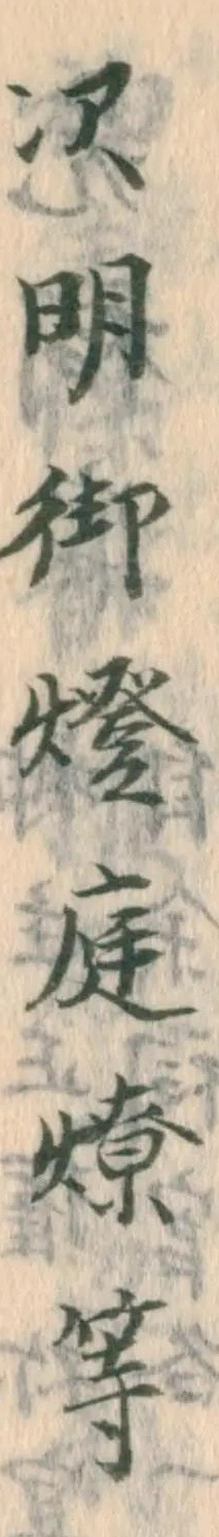次明御燈庭燎等
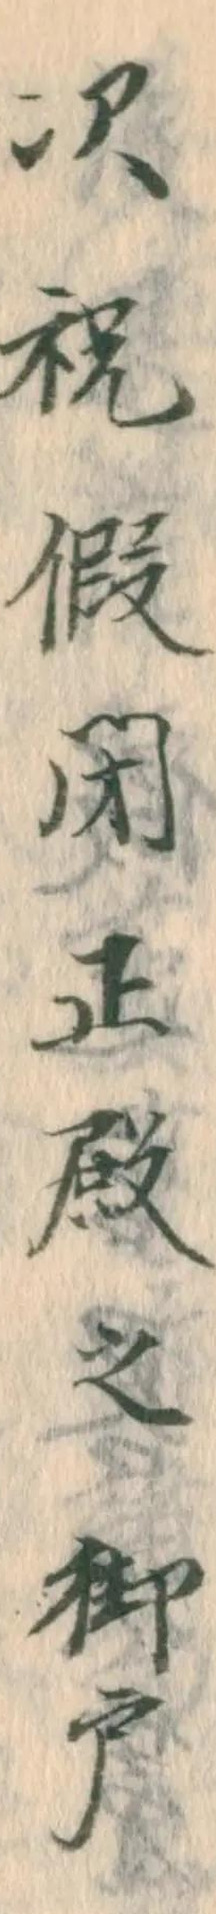次祝仮閉正殿之御戸
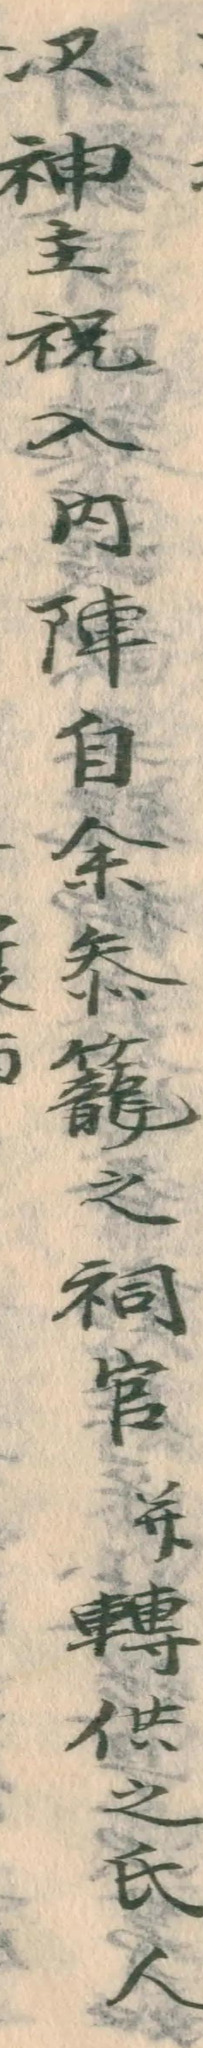次神主祝入内陣自余参籠之祠官并転供之氏人
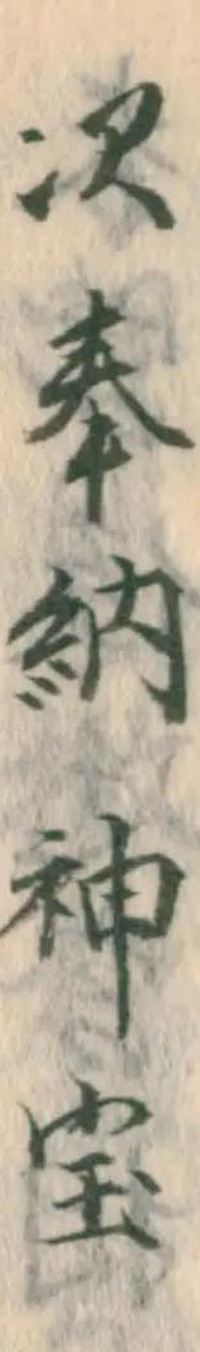次奉納神宝
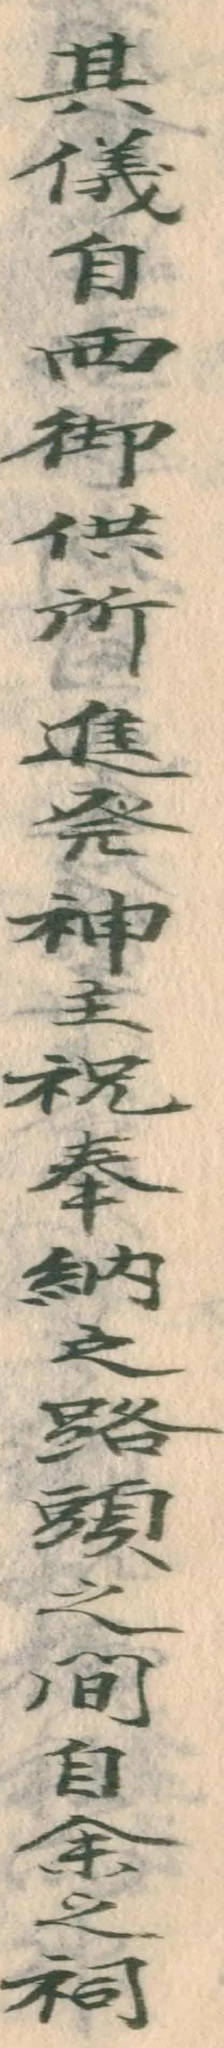其儀自西御供所進発神主祝奉納之路頭之間自余之祠
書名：賀茂社記録. 第17冊
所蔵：国立国会図書館 National Diet Library, JAPAN
